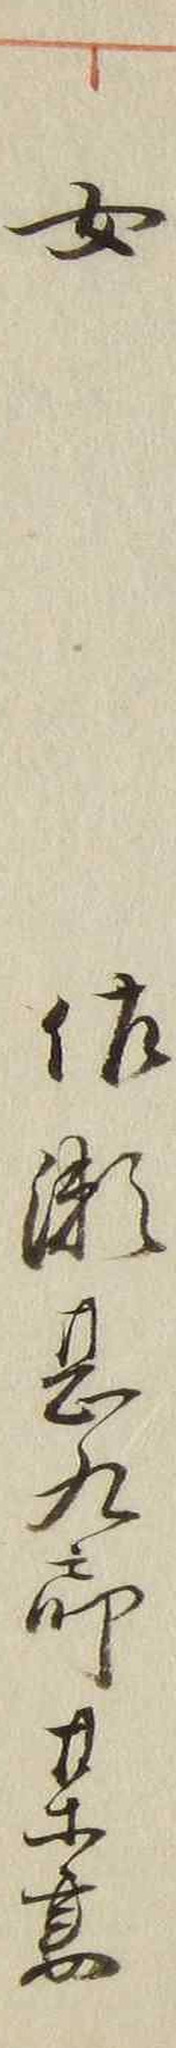女佐瀬甚九郎某妻
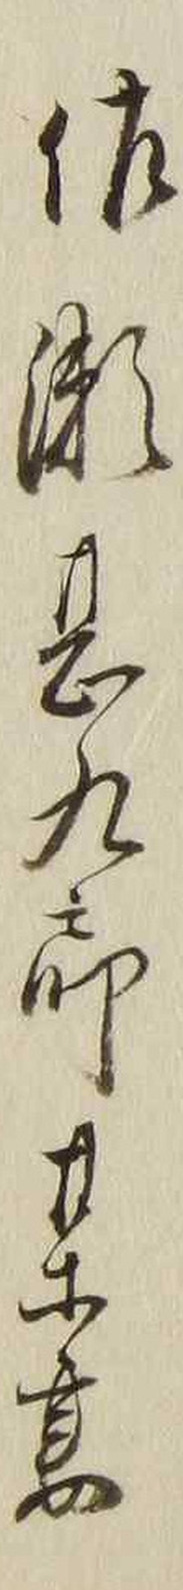女佐瀬甚九郎某妻

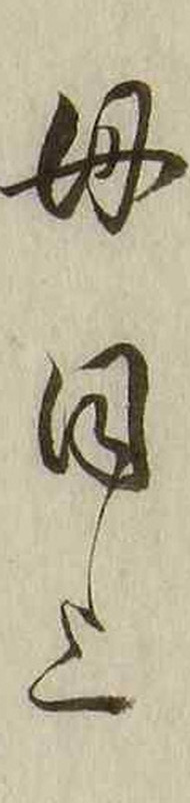母同上
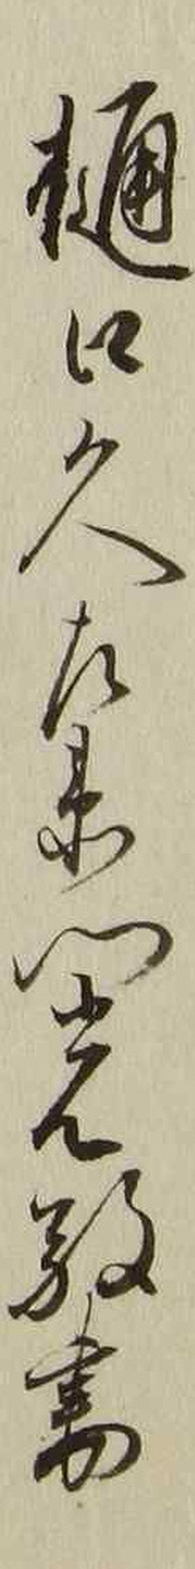女樋口久左衛門光敬妻
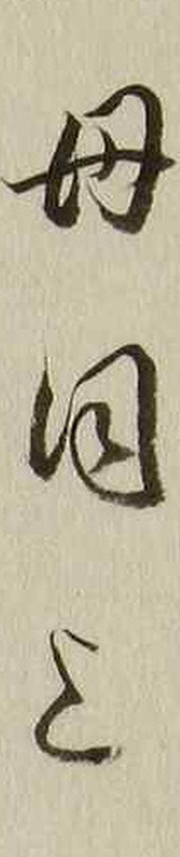母同上
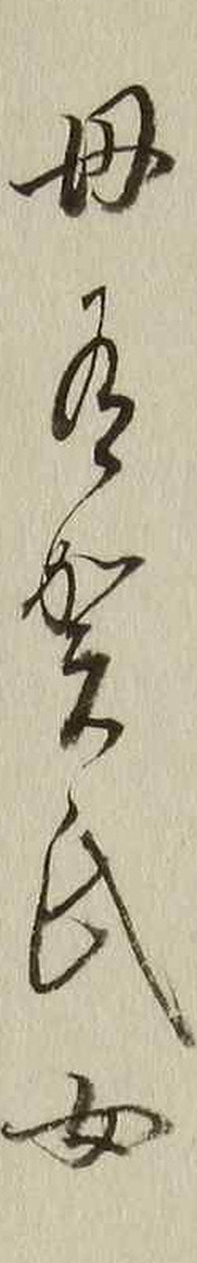母有賀氏女
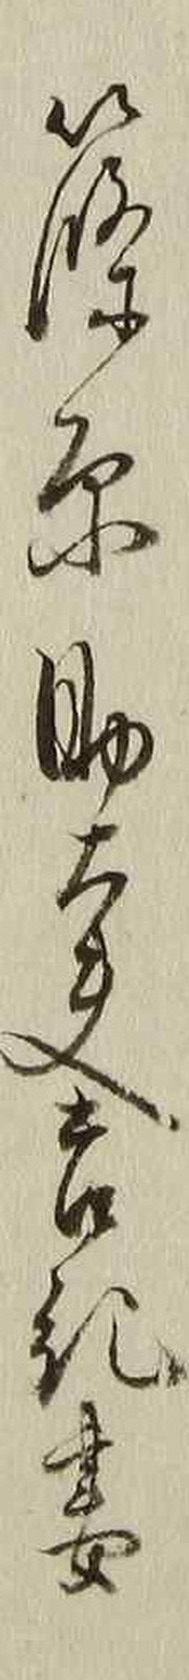女篠原助大夫吉紀妻
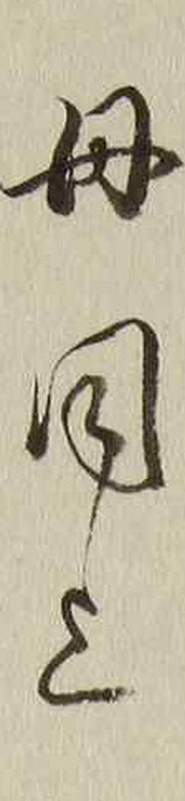母同上
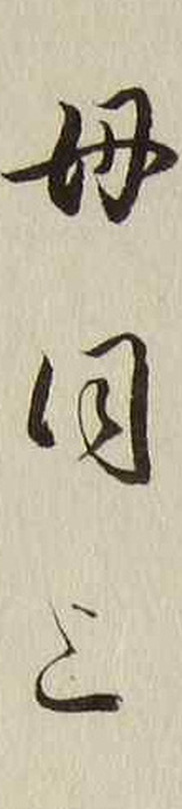母同上
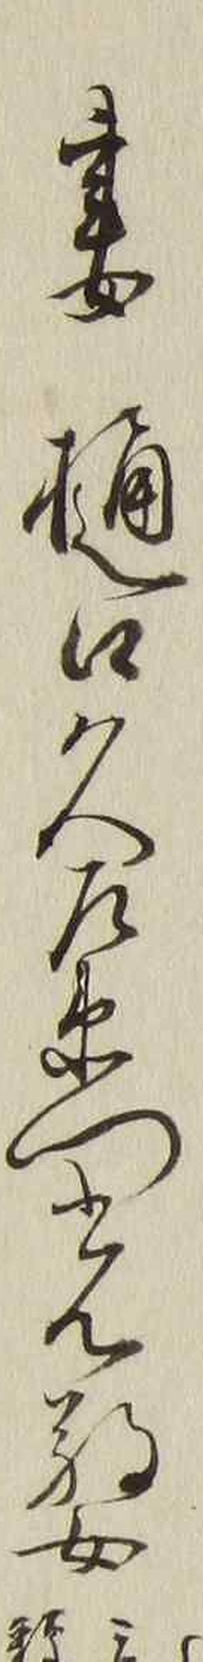女樋口久左衛門光敬妻

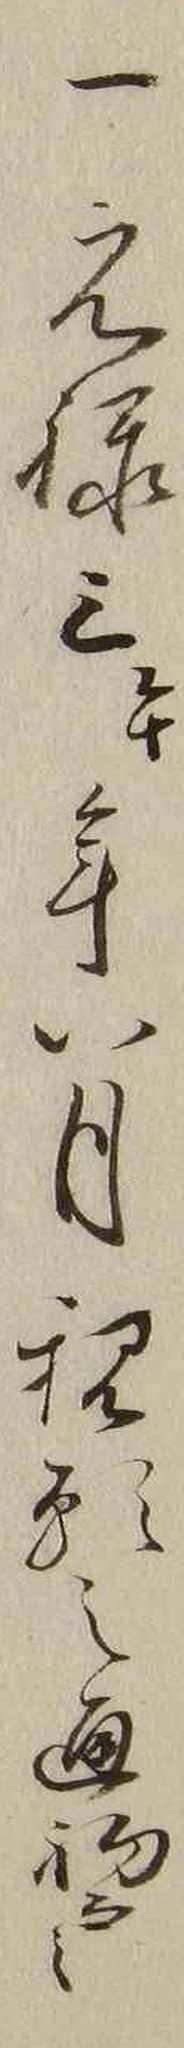一元禄三午年八月親願之通初而之
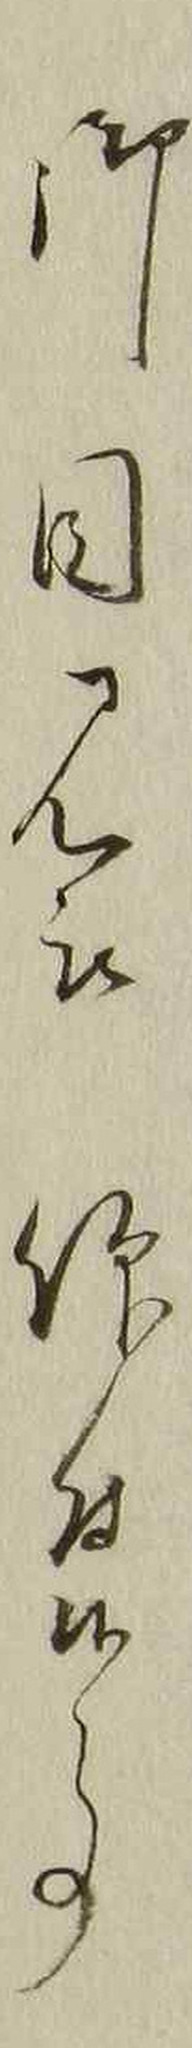御目見被仰付候事
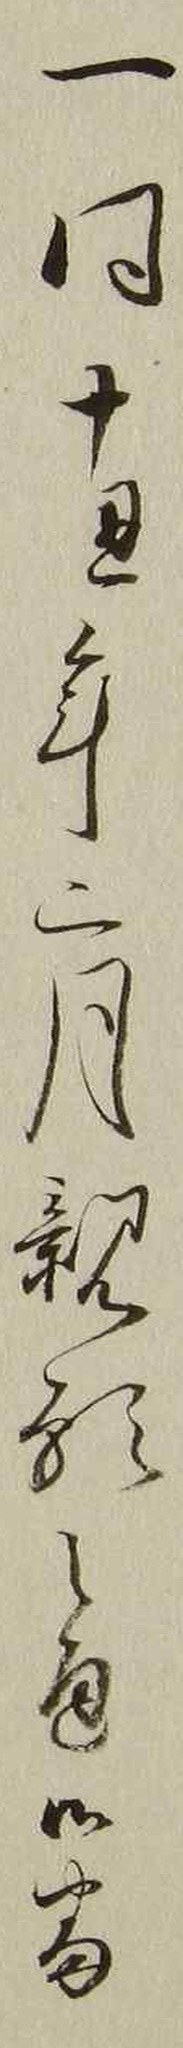一同十丑年二月親願之通御番
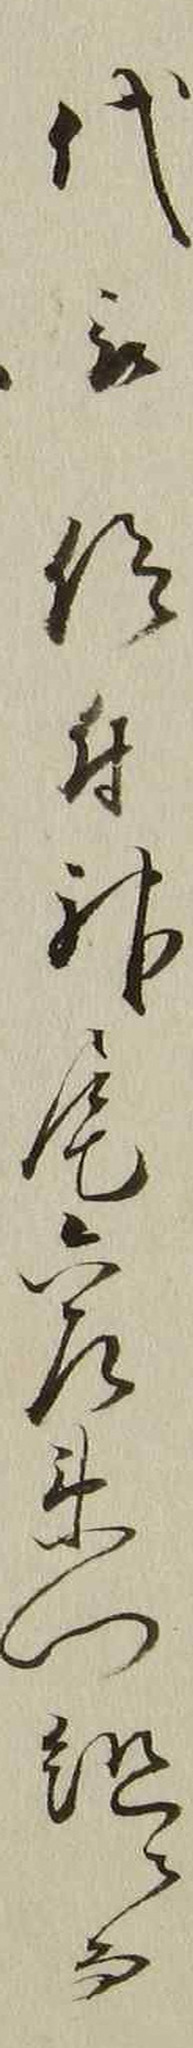代被仰付神尾六左衛門組ニ而
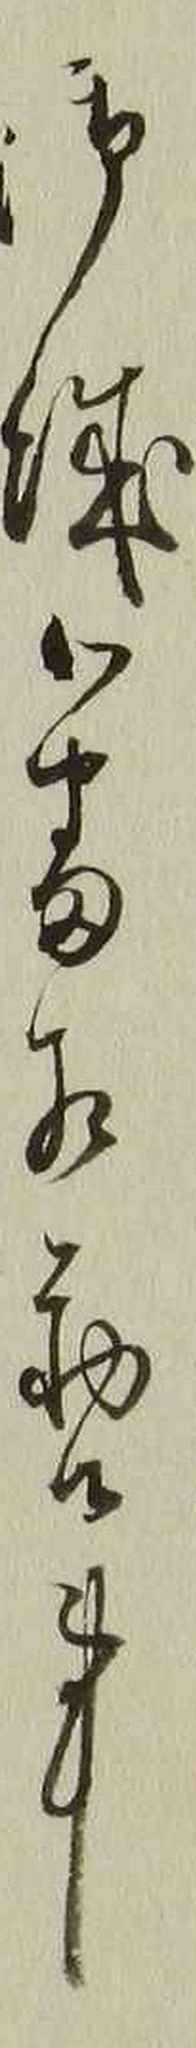御城御番相勤候事
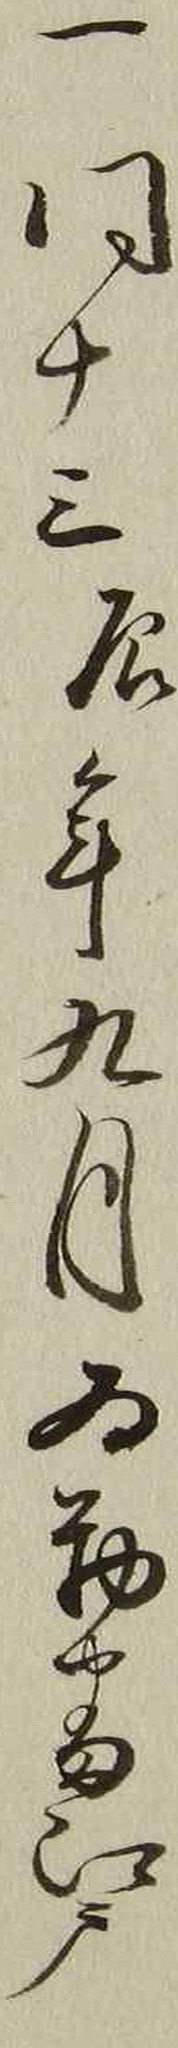一同十三辰年九月為勤番江戸
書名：諸士系譜　巻之129　た之部5
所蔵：会津若松市立会津図書館
